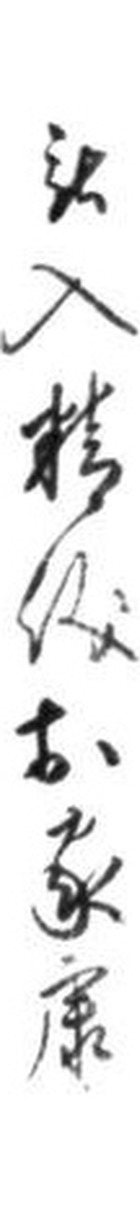被入精儀於家康
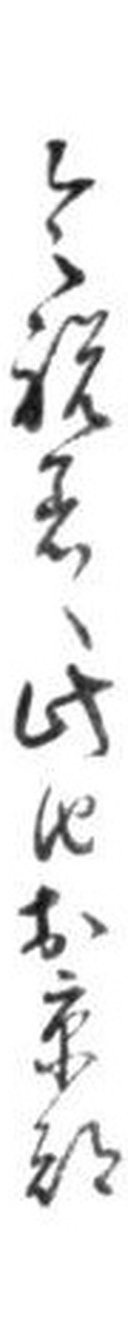令祝着候此由於京都
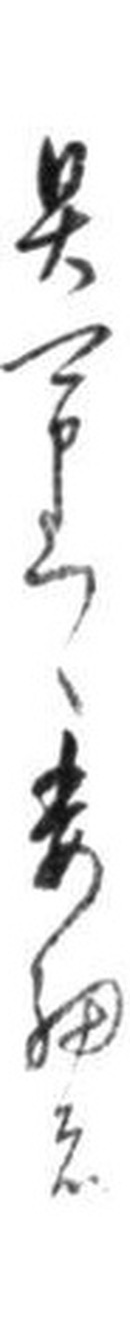具可申上候委細者
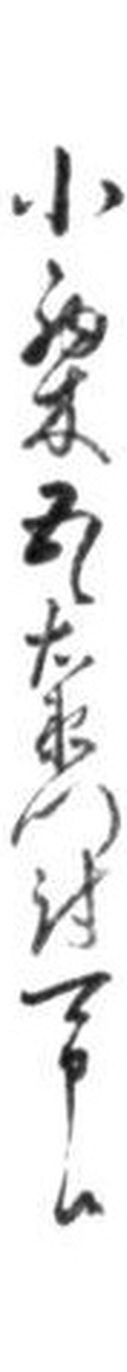小栗五郎右衛門尉可申候
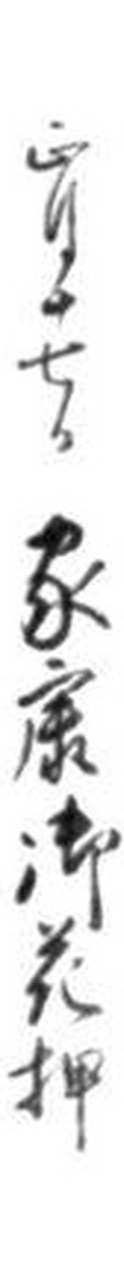正月十七日家康御花押
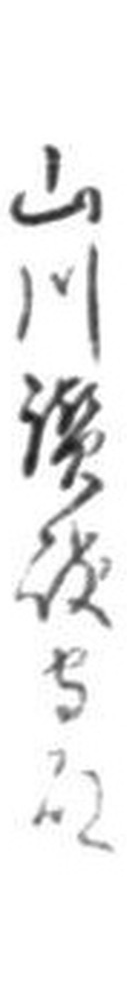山川讃岐守殿
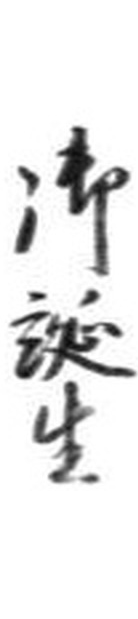御誕生
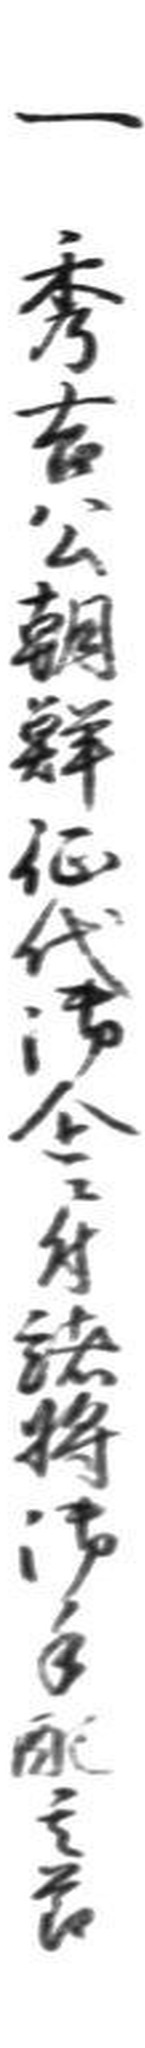一秀吉公朝鮮征代御企ニ付諸将御手配其節
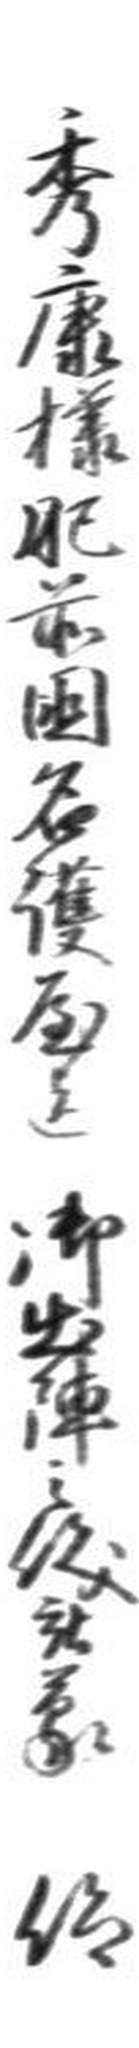秀康様肥前国名護屋迄御出陣之儀被蒙仰

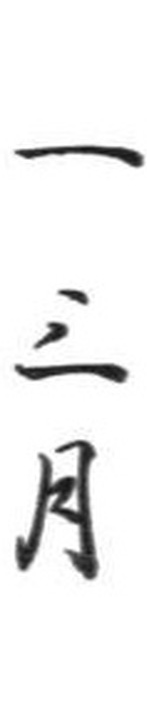一三月
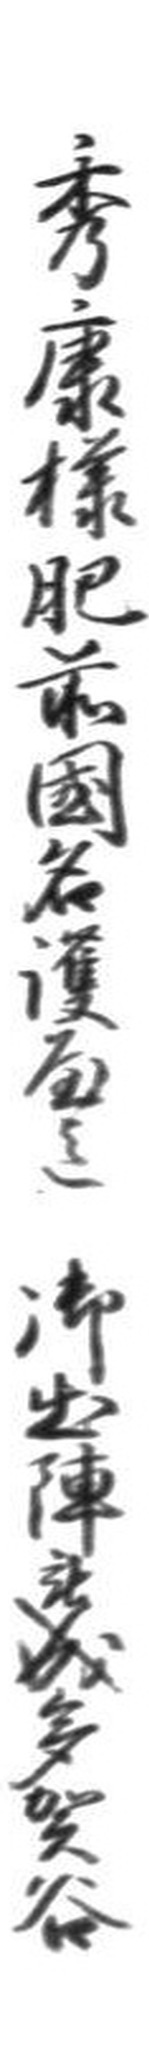秀康様肥前国名護屋迄御出陣被成多賀谷
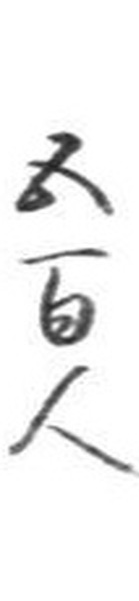五百人
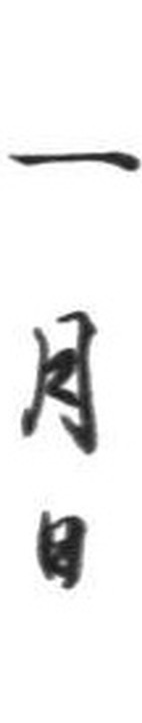一月日

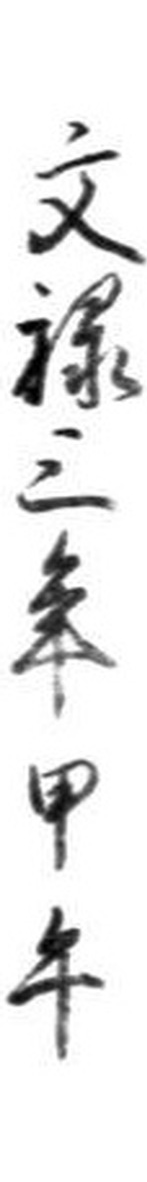文禄三年甲午
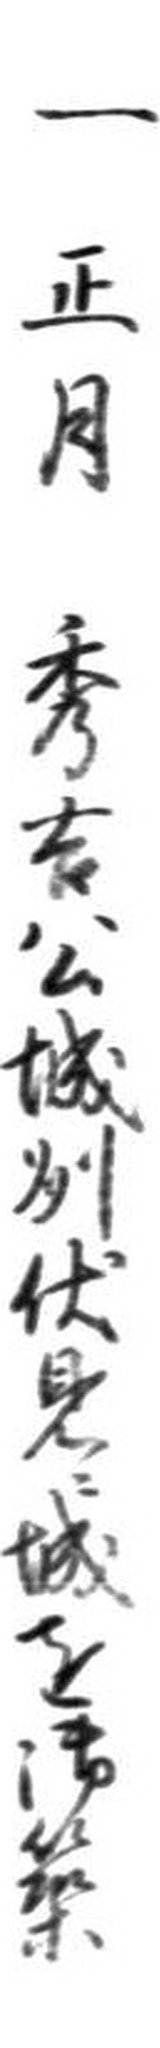一正月秀吉公城州伏見ニ城を御築
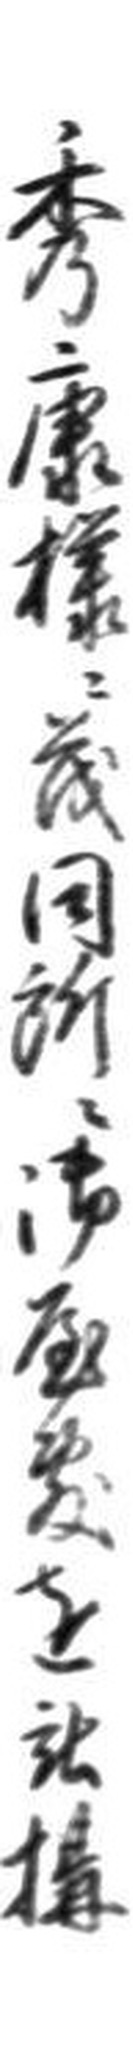秀康様ニ茂同所ニ御屋敷を被構
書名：家譜 一 秀康公 従天正二年到慶長十二年
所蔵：福井県文書館 Fukui Prefectural Archives
